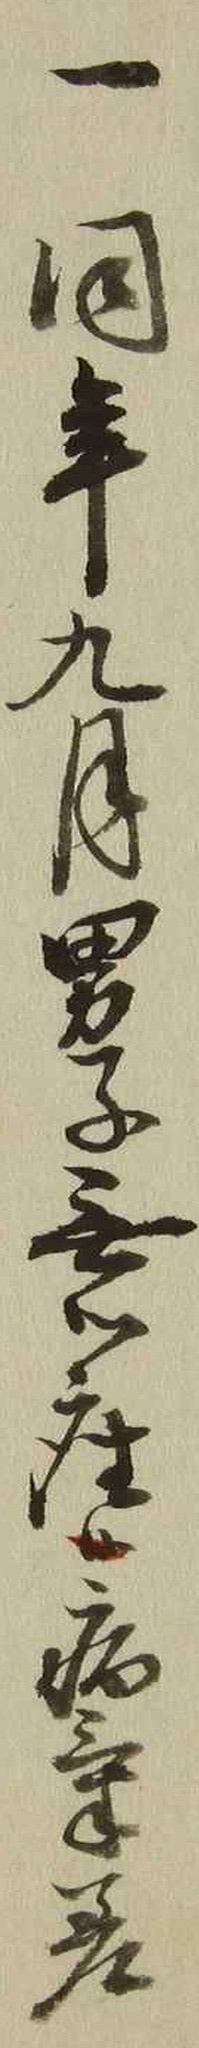一同年九月男子無御座候病気差
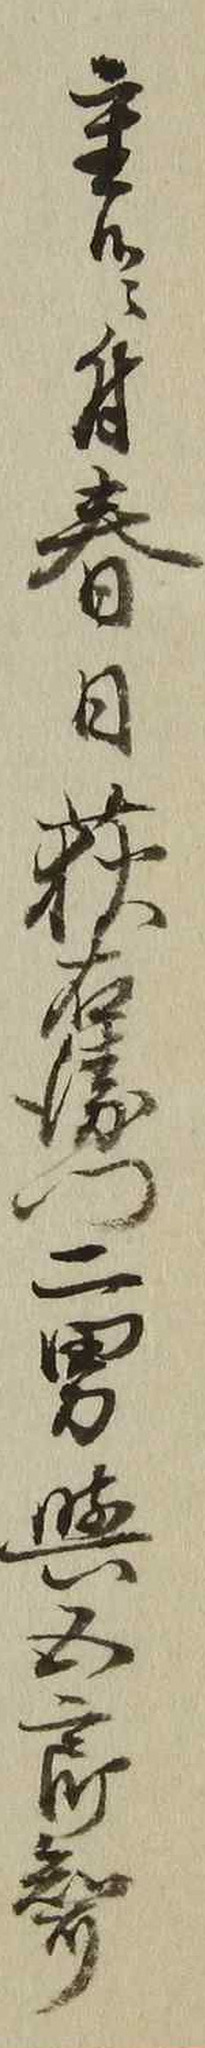重候ニ付春日荻右衛門二男与五郎聟
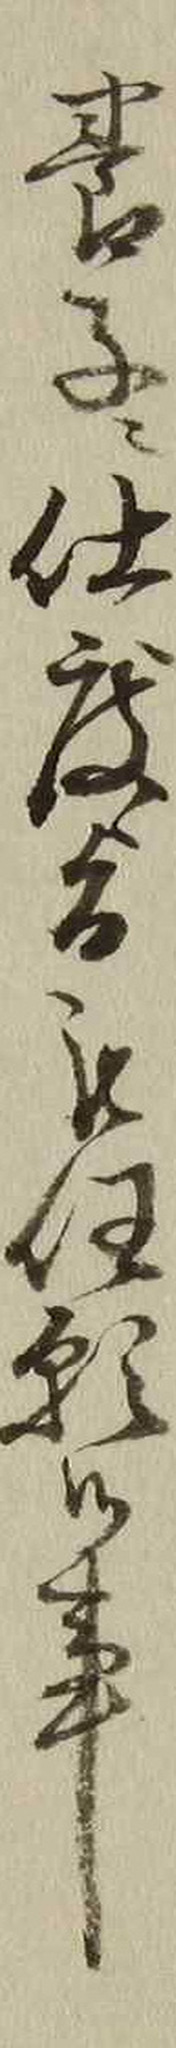養子ニ仕度旨被任願候事
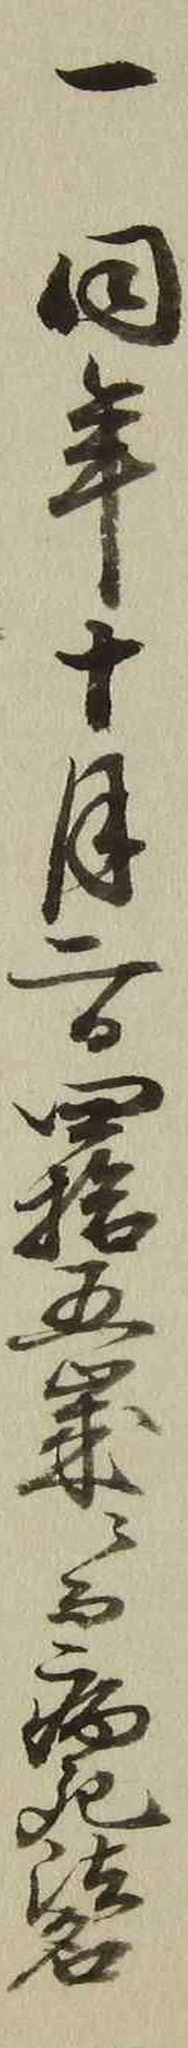一同年十月二日四拾五歳ニ而病死法名
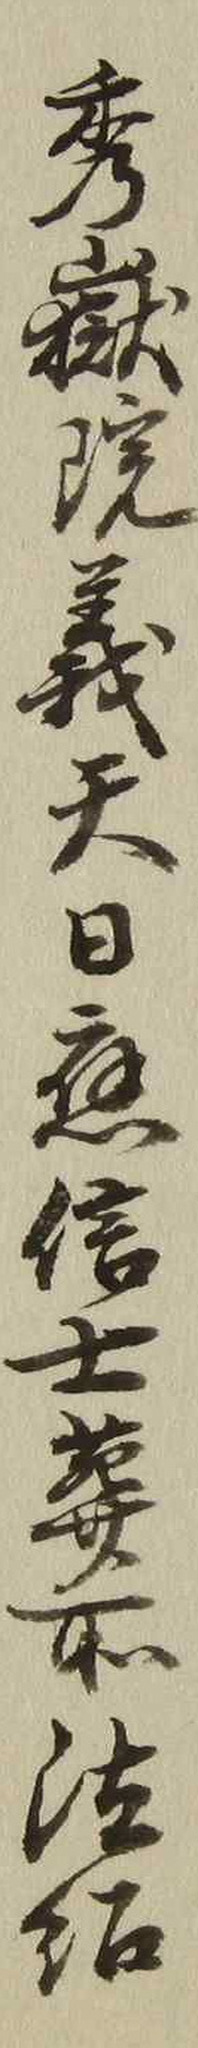秀嶽院義天日応信士葬所法紹
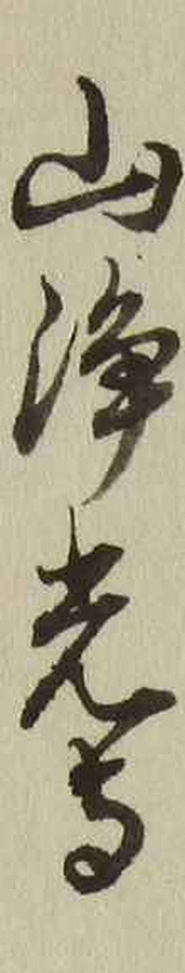山浄光寺
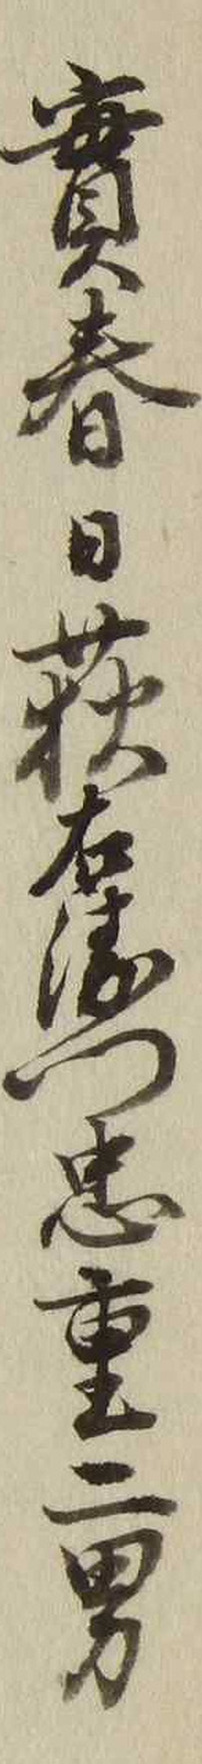実春日荻右衛門忠重二男

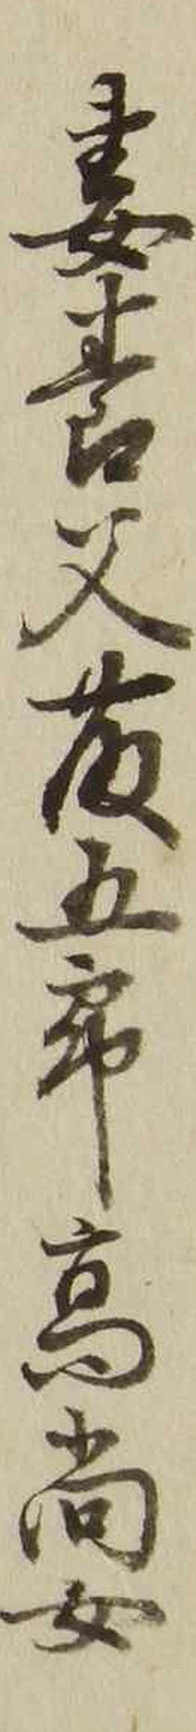妻養父藤五郎高尚女
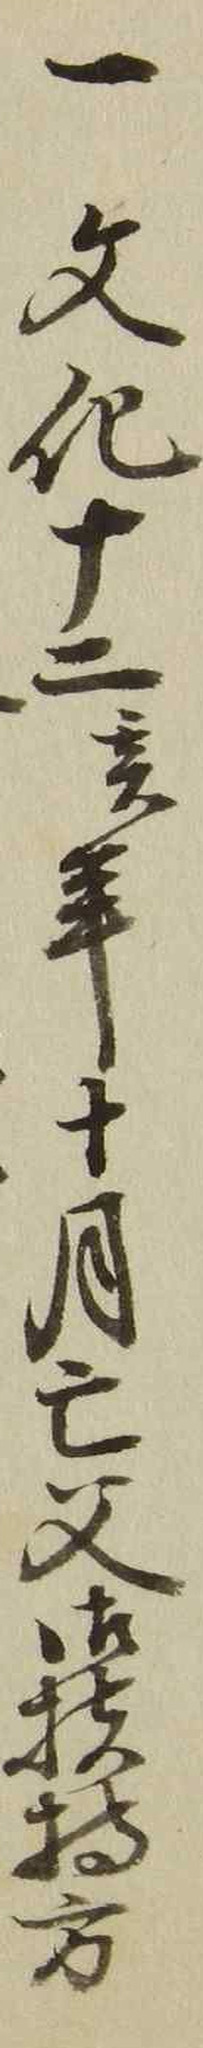一文化十二亥年十月亡父御扶持方
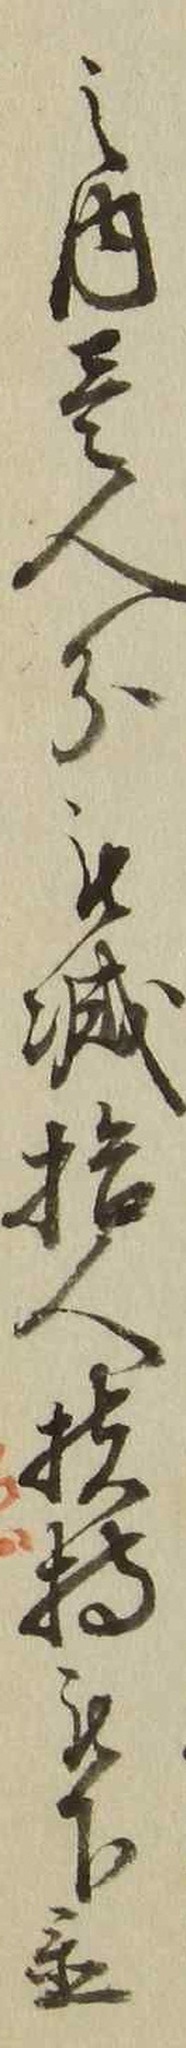之内壱人分被減拾人扶持被下置
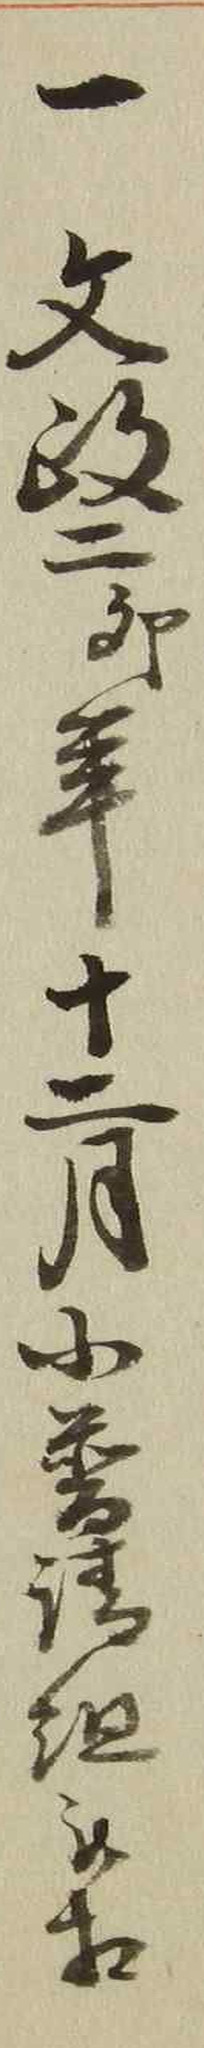一文政二卯年十二月小普請組被相
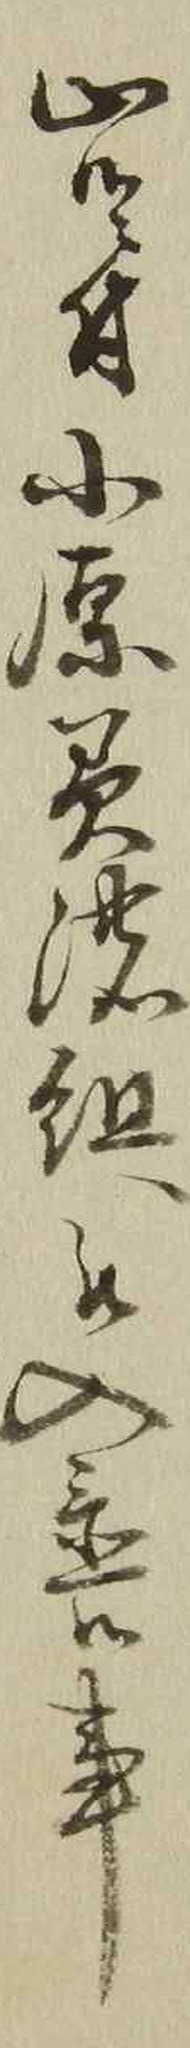止候ニ付小原美濃組へ被入置候事
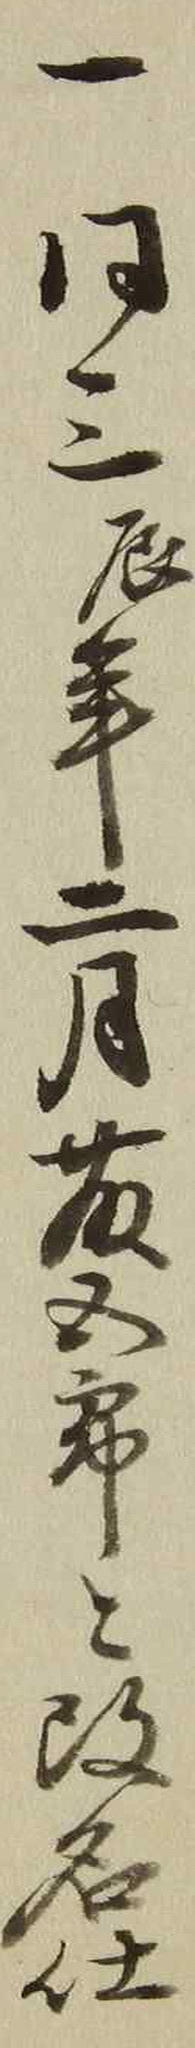一同三辰年二月藤五郎と改名仕
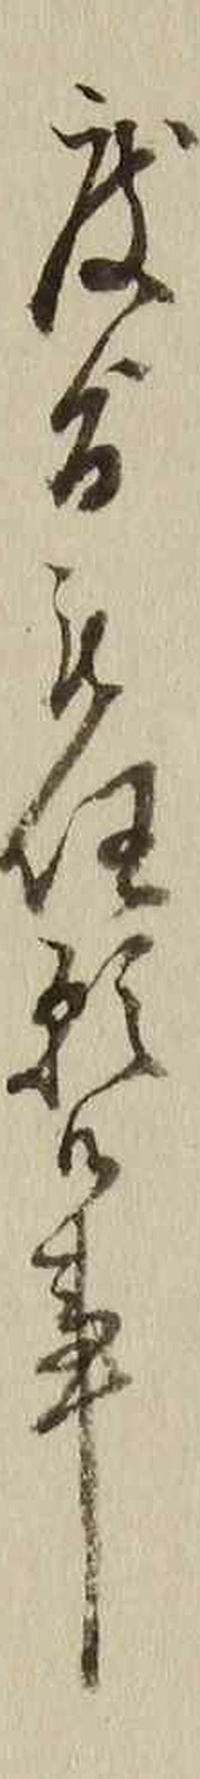度旨被任願候事
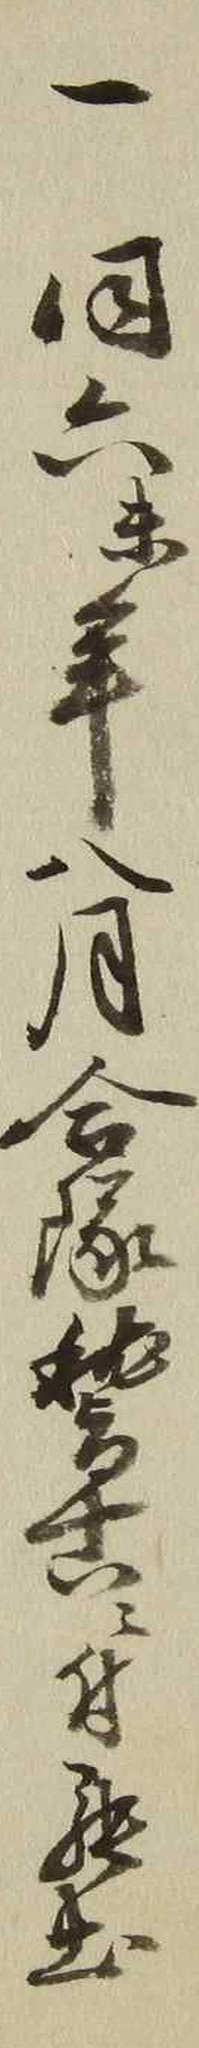一同六未年八月合隊稽古ニ付罷出
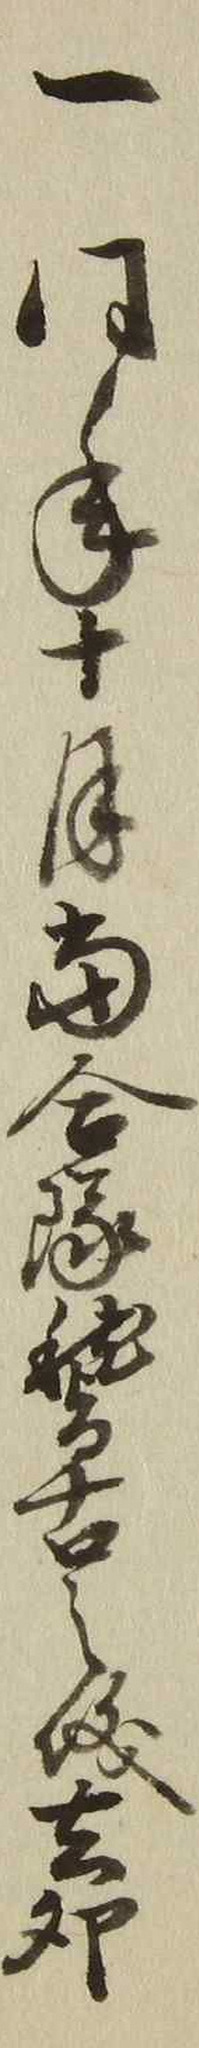一同年十月当合隊稽古之儀去卯
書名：諸士系譜　巻之31　い之部31
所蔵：会津若松市立会津図書館
